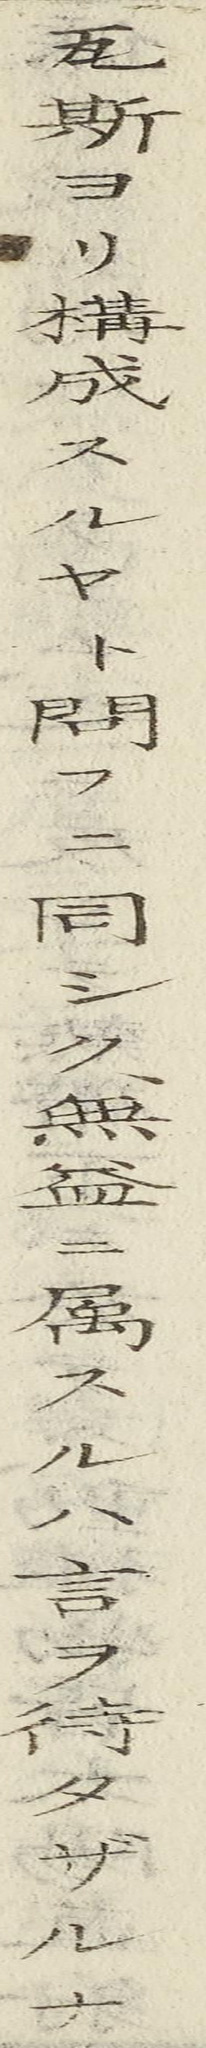瓦斯ヨリ構成スルヤト問フニ同シク、無益ニ属スルハ言ヲ待タザルナ
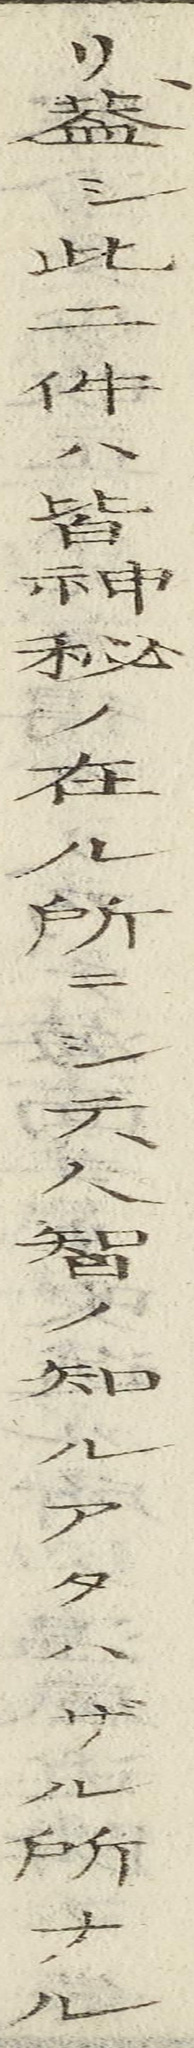リ、蓋シ此二件ハ皆神秘ノ在ル所ニシテ、人智ノ知ルアタハザル所ナル
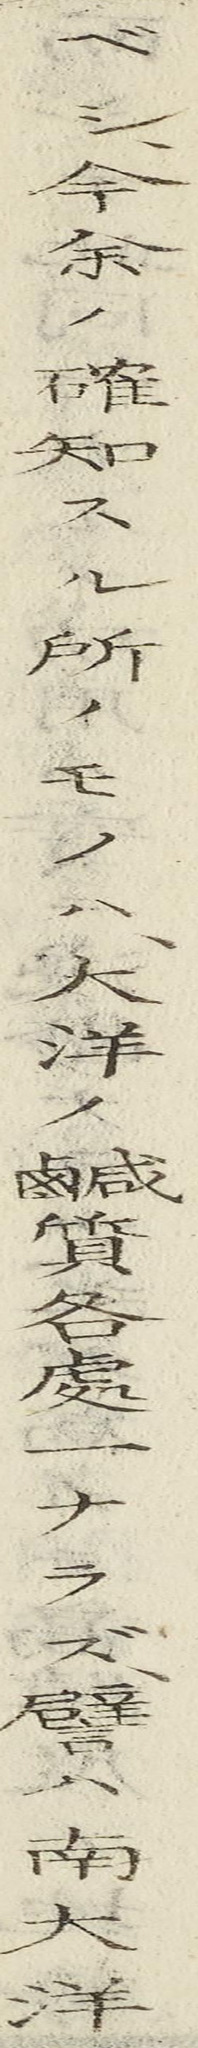ベシ、今余ノ確知スル所ノモノハ、大洋ノ鹹質各処一ナラズ、譬ハ南大洋
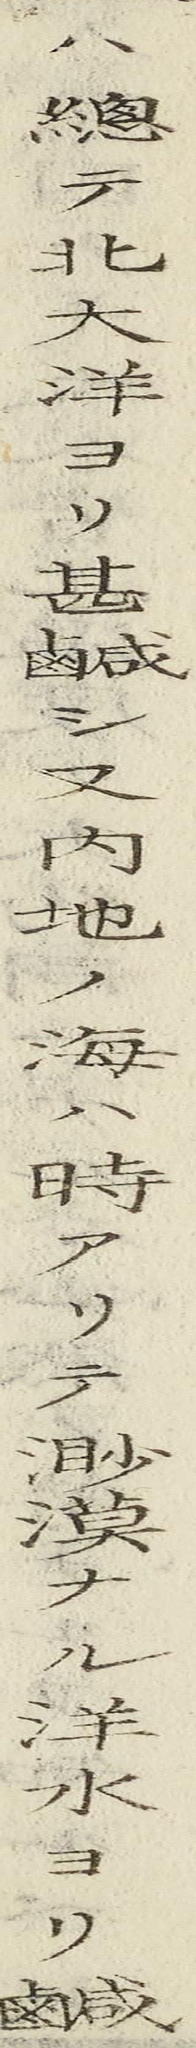ハ総テ北大洋ヨリ甚鹹シ又内地ノ海ハ時アリテ渺漠ナル洋水ヨリ鹹
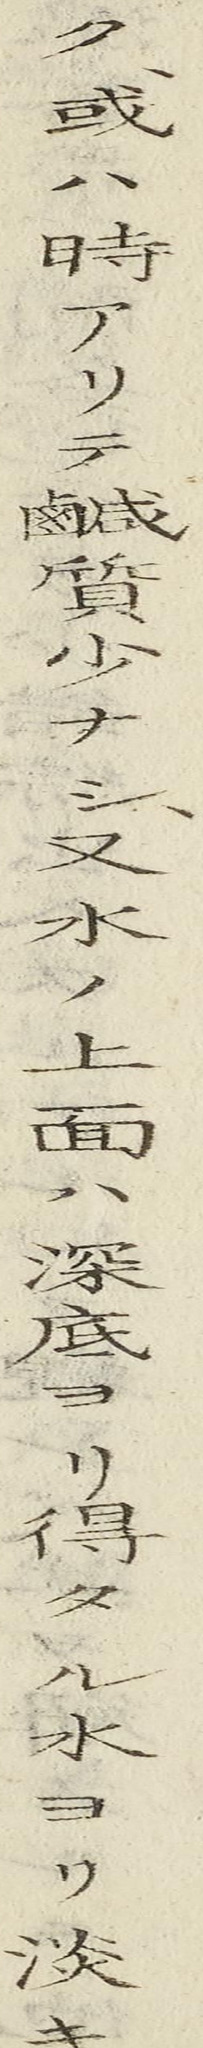ク、或ハ時アリテ鹹質少ナシ、又水ノ上面ハ深底ヨリ得タル水ヨリ淡キ
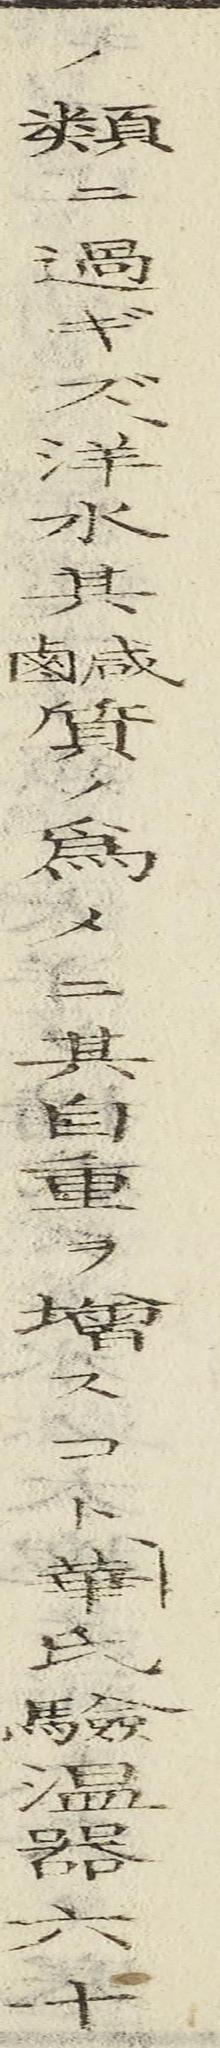ノ類ニ過ギズ、洋水其鹹質ノ為メニ其自重ヲ増スコト、華氏験温器六十
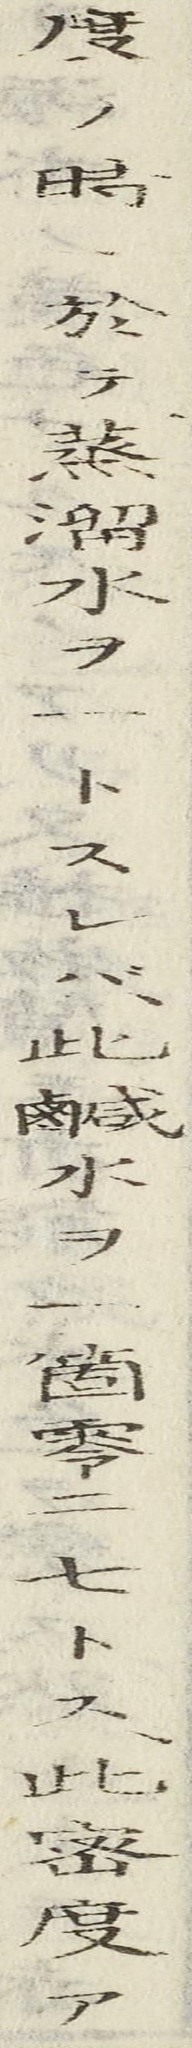度ノ時ニ於テ蒸留水ヲ一トスレバ、此鹹水ヲ一箇零ニ七トス、此密度ア
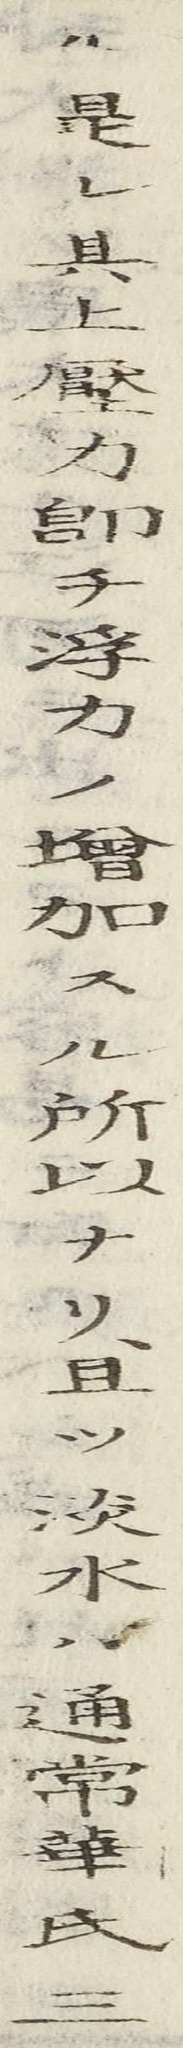ル是レ其上圧力即チ浮力ノ増加スル所以ナリ、且ツ淡水ハ通常華氏三
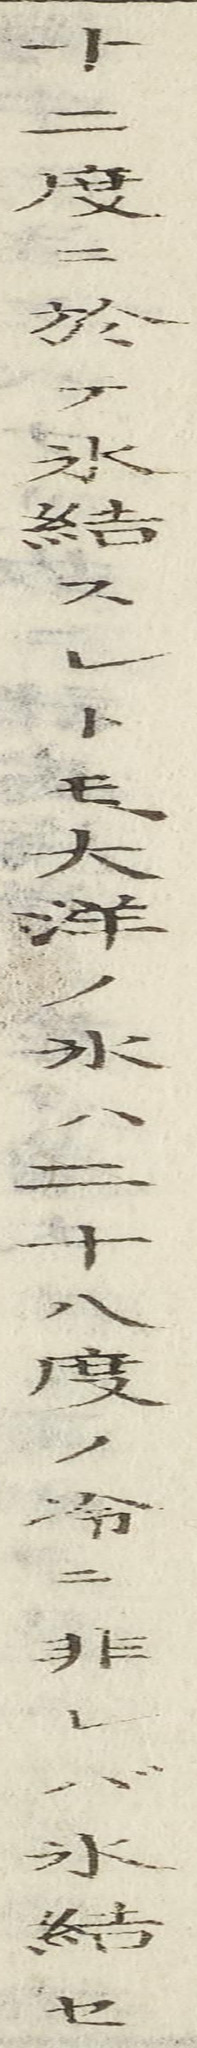十二度ニ於テ氷結スレトモ、大洋ノ氷ハ二十八度ノ冷ニ非レバ氷結セ
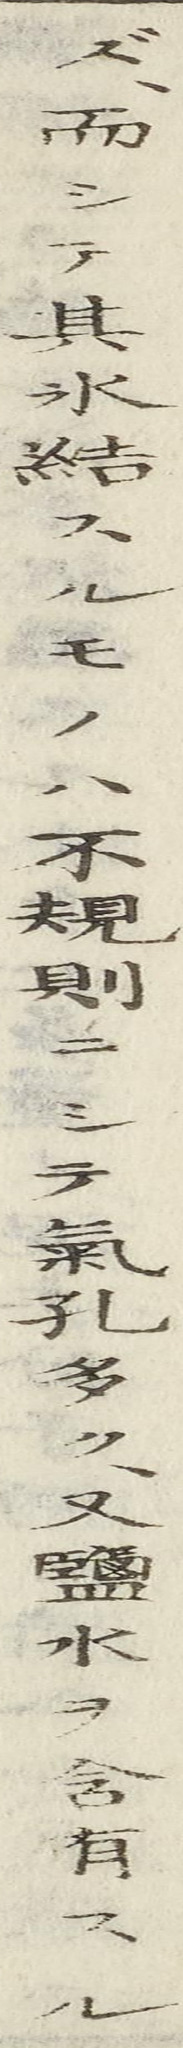ズ、而シテ其氷結スルモノハ不規則ニシテ気孔多ク、塩水ヲ含有スル
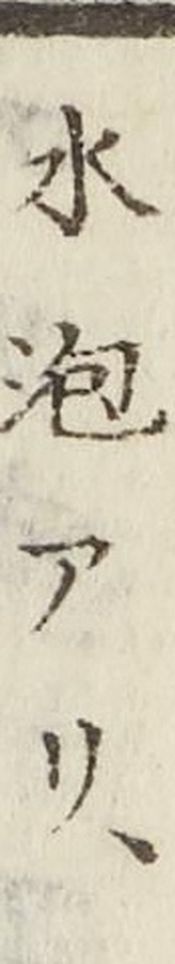水疱アリ、
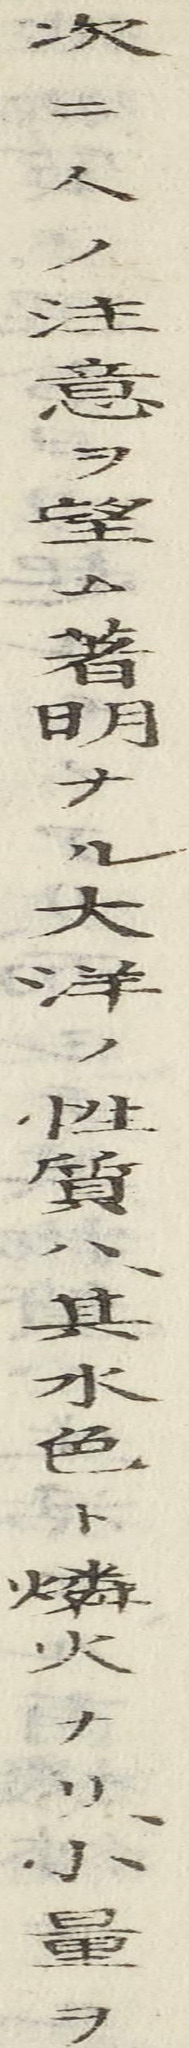次ニ人ノ注意ヲ望ム著明ナル大洋ノ性質ハ、其水色ト燐火ナリ、小量ヲ
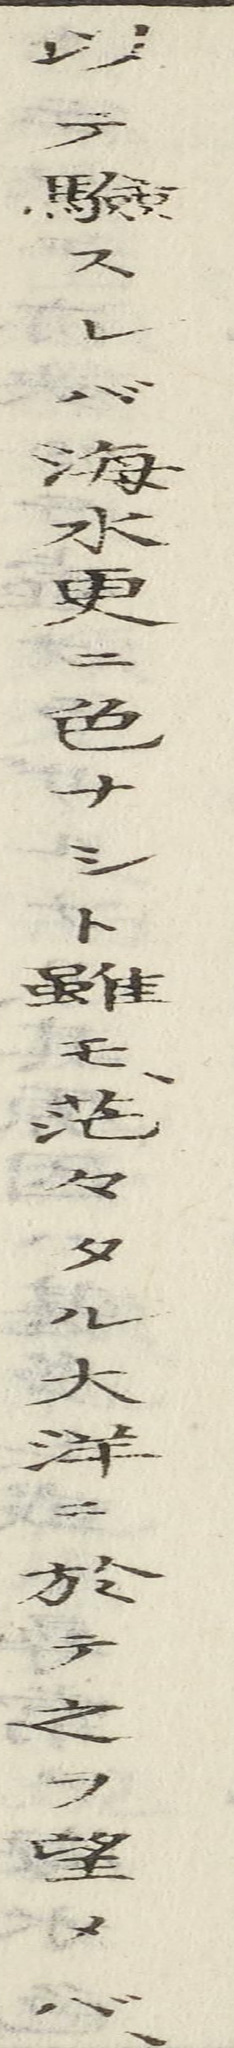以テ験スレバ海水更ニ色ナシト雖モ、茫々タル大洋ニ於テ之ヲ望メバ、
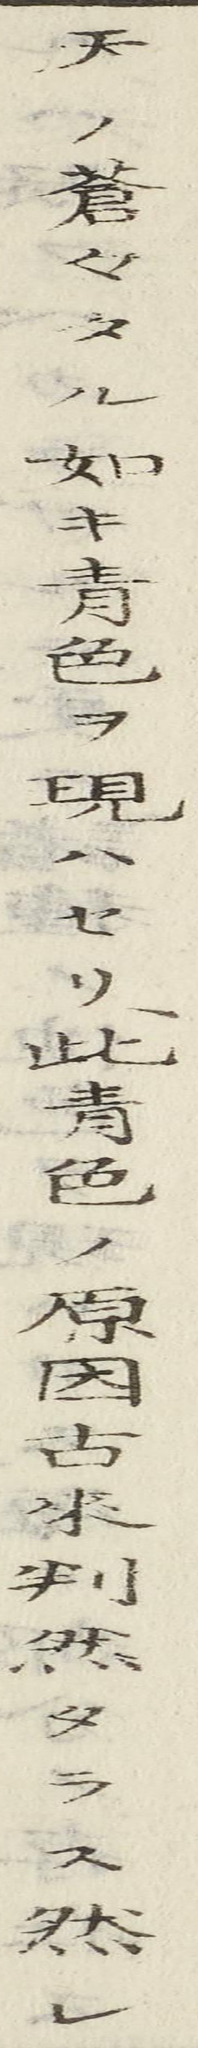天ノ蒼々タル如キ青色ヲ現ハセリ、此青色ノ原因古来判然タラス然レ
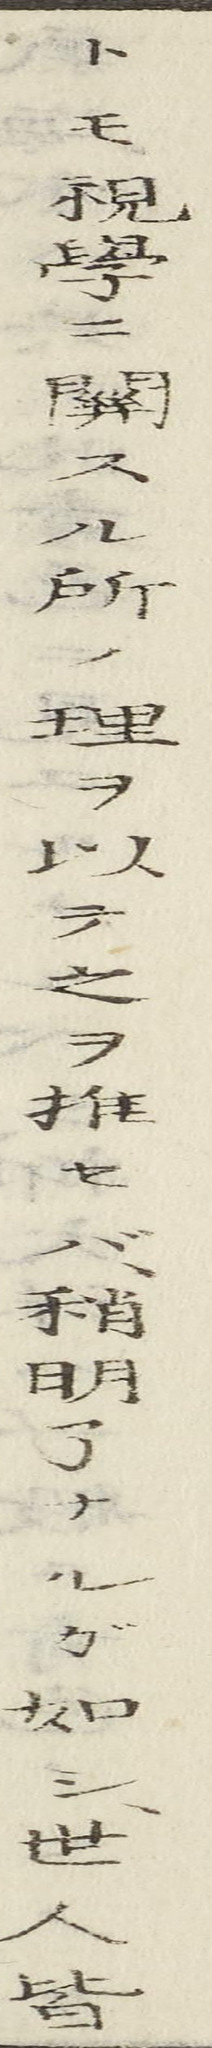トモ、視学ニ関スル所ノ理ヲ以テ之ヲ推セバ、稍明了ナルガ如シ、世人皆
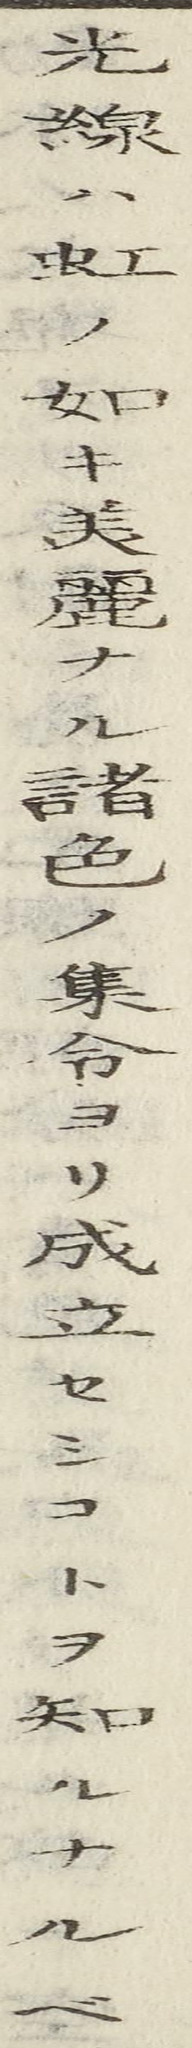光線ハ虹ノ如キ美麗ナル諸色ノ集合ヨリ成立セシコトヲ知ルナルベ
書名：百科全書　地文學　全
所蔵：東京大学地震研究所図書室 Earthquake Research Institute Library, The University of Tokyo, JAPAN
